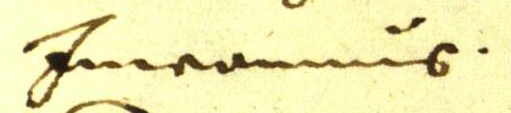Inwonnūng.
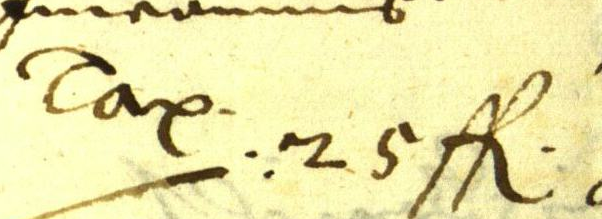Tax. —: 25 fl.
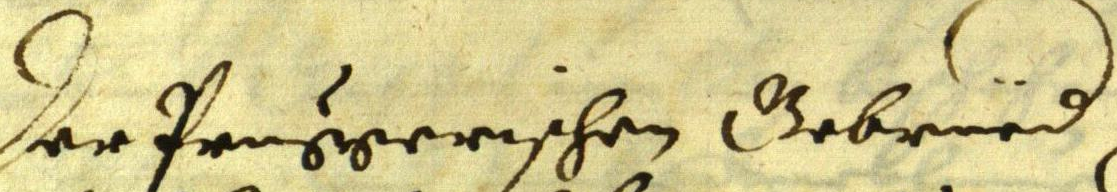Der Prūggerischen Gebrüed
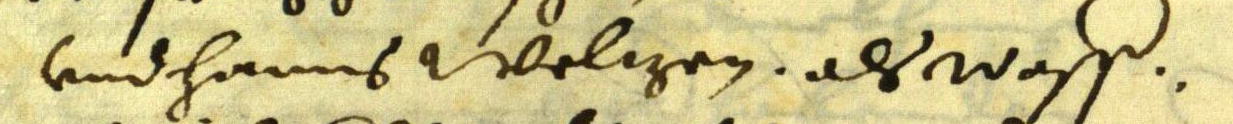vnd hanns Weltzen. als Wass¬
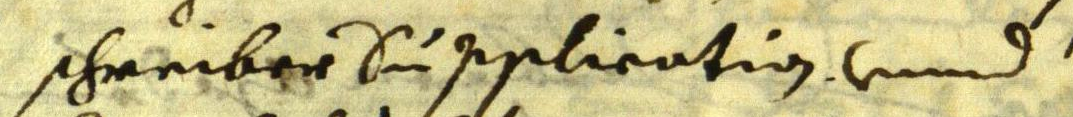schreiber Sūpplication. vnnd
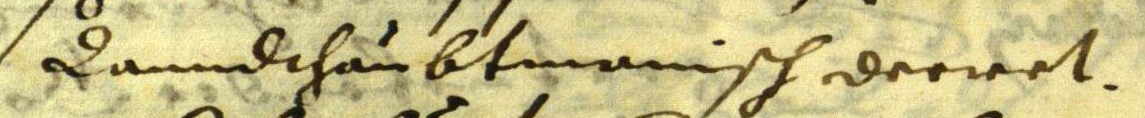Lanndthaūbtmanisch decret.
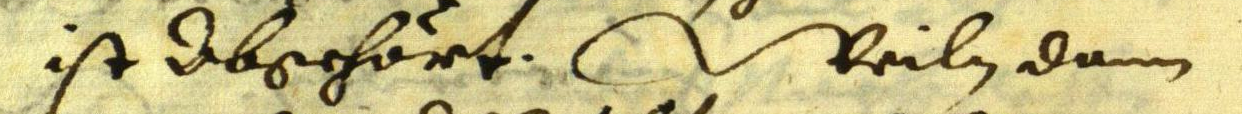ist Abgehōrt. Weiln dann
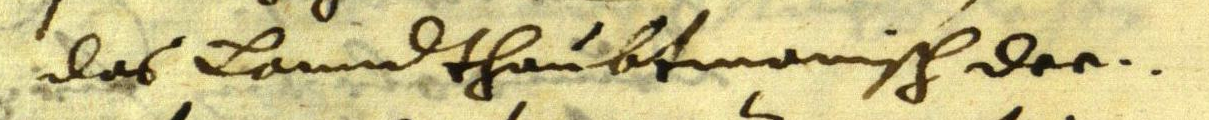das Lanndthaūbtmanisch dec¬
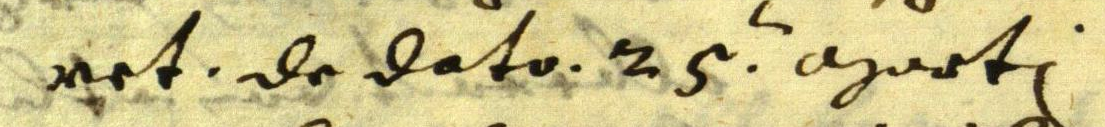ret. de dato. 25.t Martj
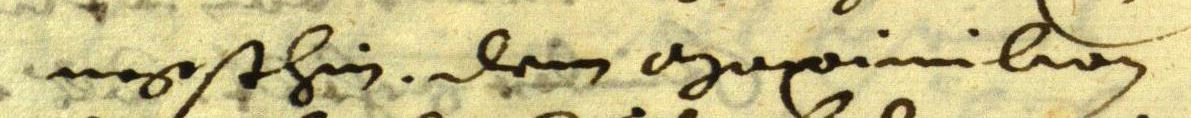negsthin. dem Maximilian
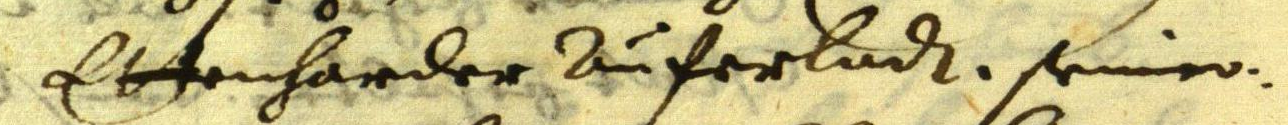Ettenharder Aūferladt. seiner¬
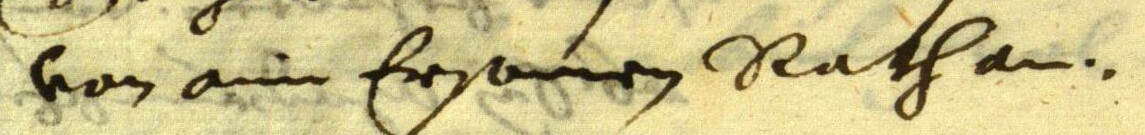von aim Ersamen Rath an¬
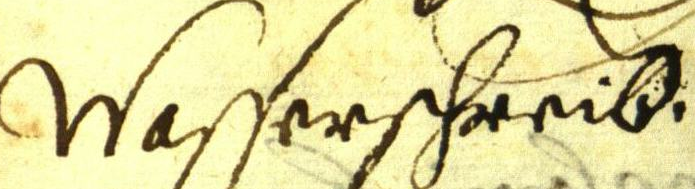Wasserschreib.
